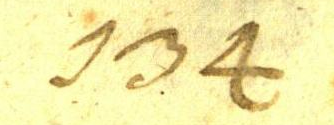134
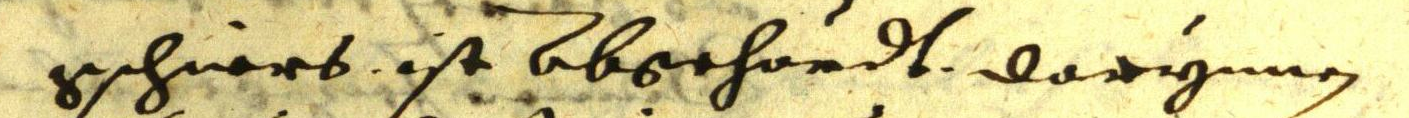gschiers. ist Abgehōrdt. darȳnnen
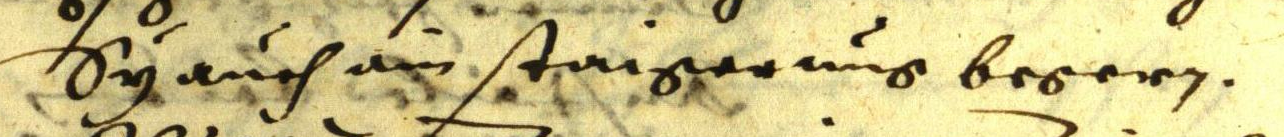Sȳ aūch ain staigerūng begern.
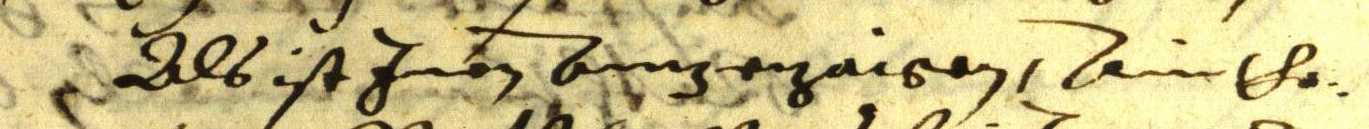Als ist Inen Anzezaigen, Ain Er¬
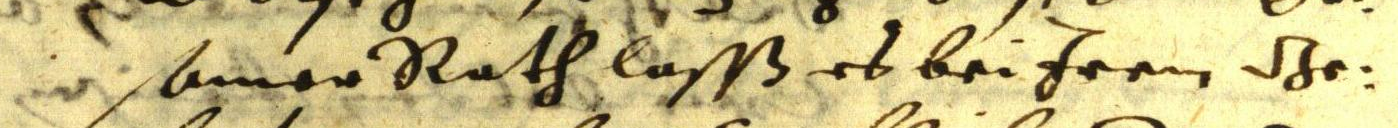samer Rath lasß es bei Iren Ge¬
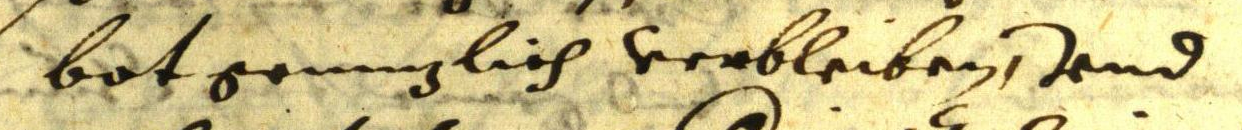bot gennzlich verbleiben, Vnd
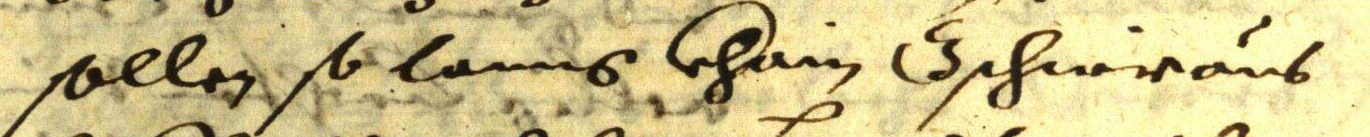sollen so lanng khain Gschirr aūs
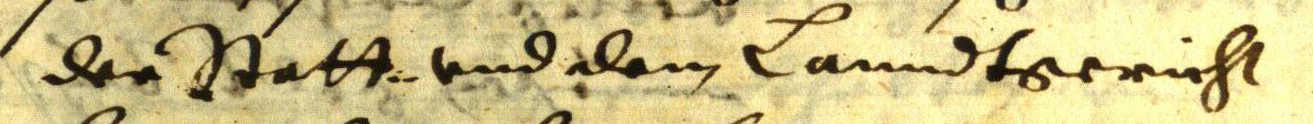der Statt: vnd dem Lanndtgericht
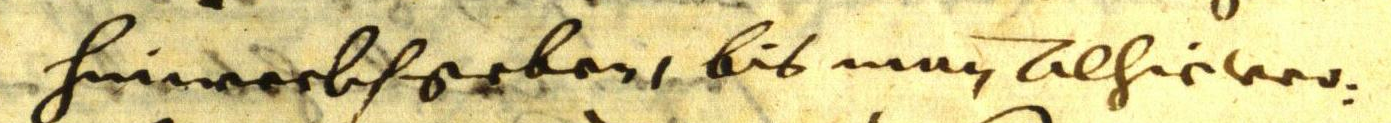hinweckhgeben, bis man Alhie ver¬
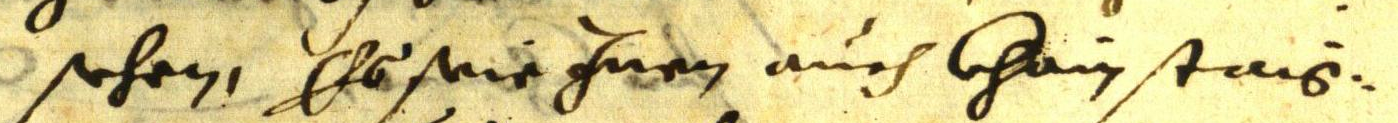sehen, Es seie Inen aūch khain staig¬
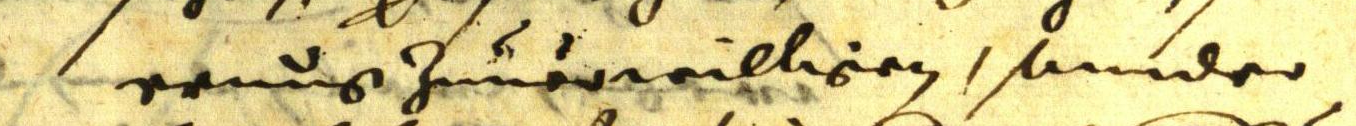erūng Zūūerwilligen, sonnder
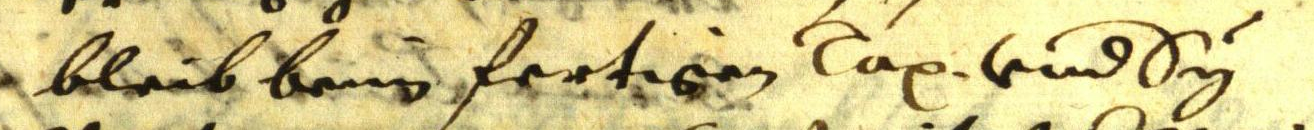bleib beim fertigen Tax vnd Sȳ
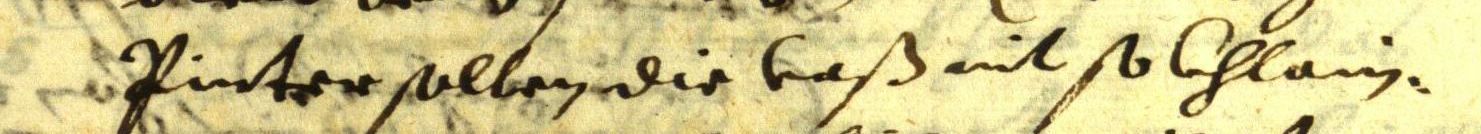Pinter sollen die vaß nit so khlain¬
